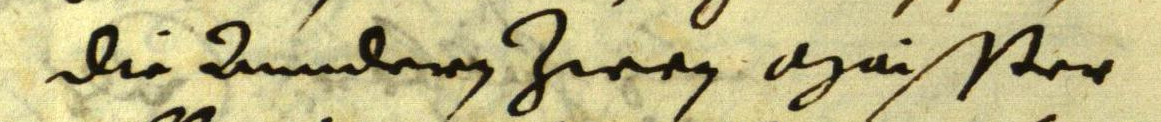die Anndern Zwen Maisster
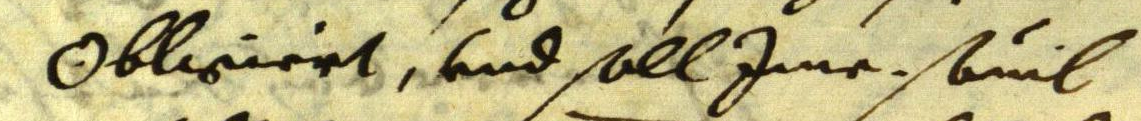Obligiert, vnd soll Ime. sovil
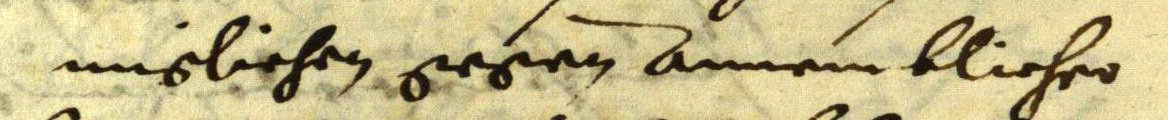miglichen gegen Annemblicher
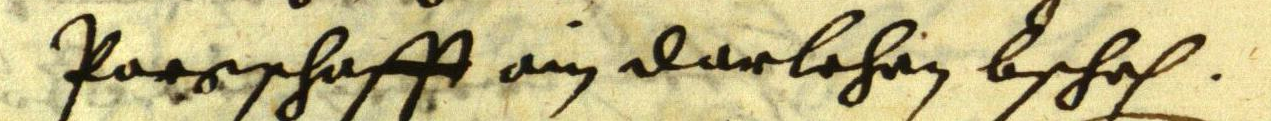Porgschafft ain darlehen bscheh.
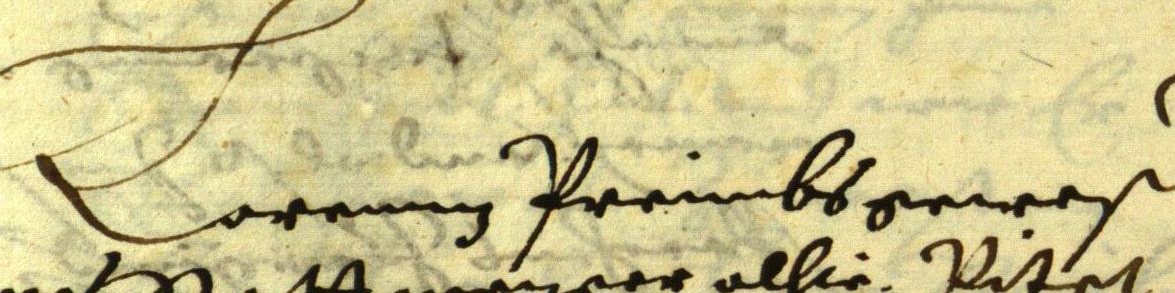Lorennz Preimbs gewest
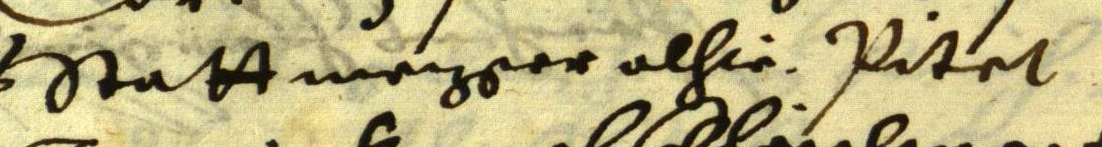Statt mezger alhie. Pitet
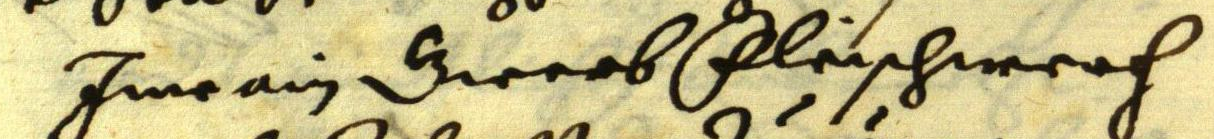Ime ain Gwerb Fleischwerch
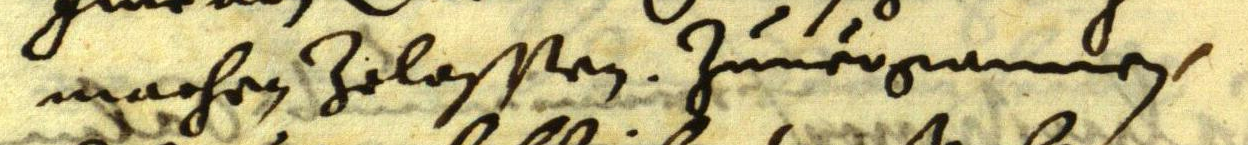machen Zelassen. Zūuērgonnen,
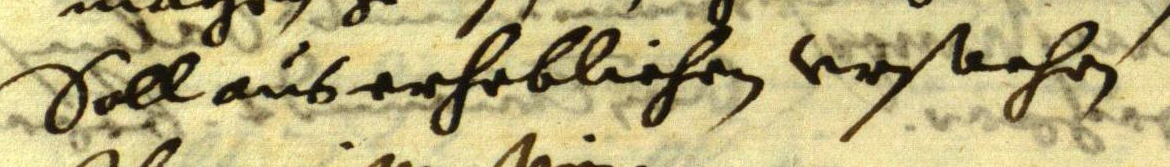Soll aūs erheblichen ursachen
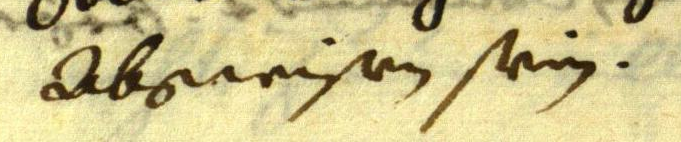Abgwisen sein.
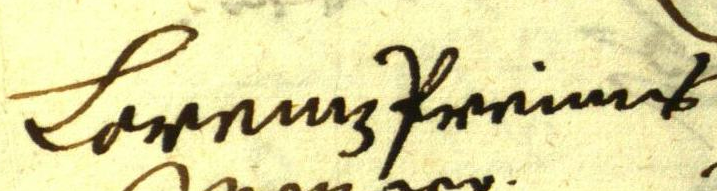Lorenz Preims
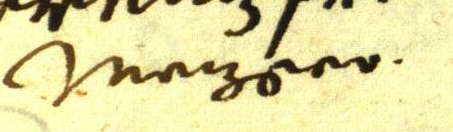Mezger.
